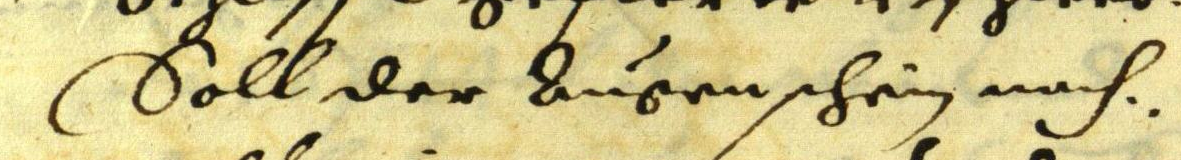Soll der Aūgenschein noch¬
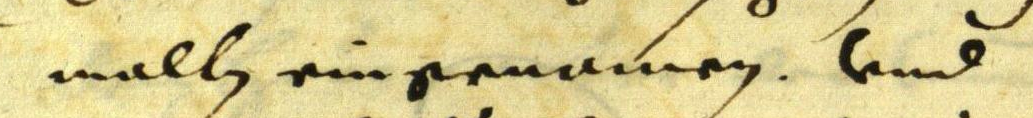malln eingenomen. vnd
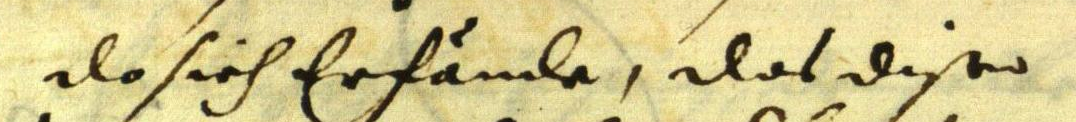da sich Erfānde, das diser
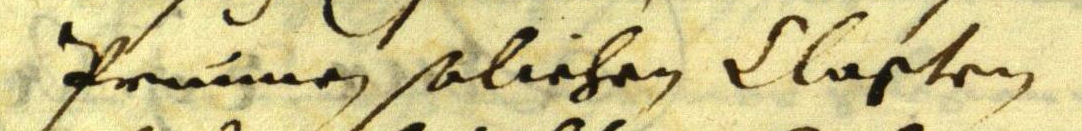Prūnnen solichen Clagten
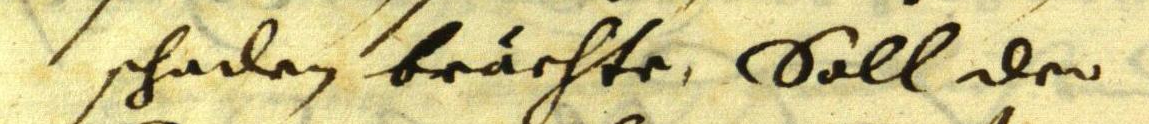schaden brāchte, Soll der
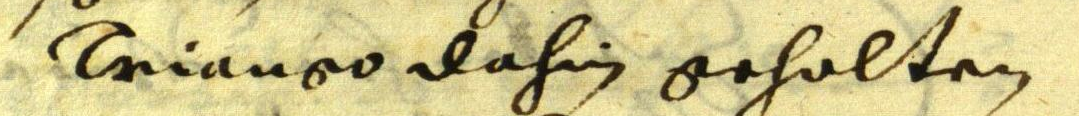Triango dahin gehalten
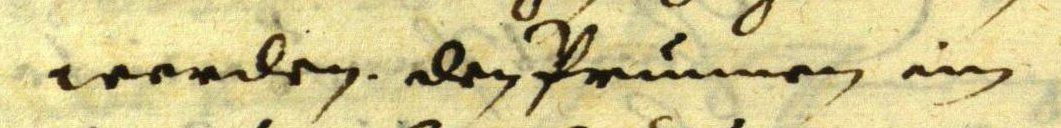werden. den Prūnnen im
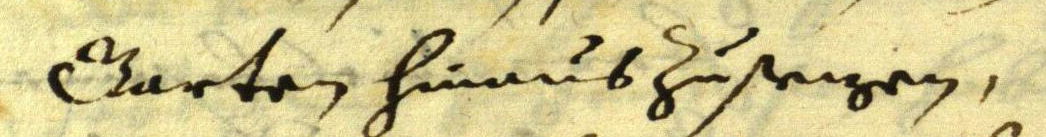Garten hinaūs Zūsezen,
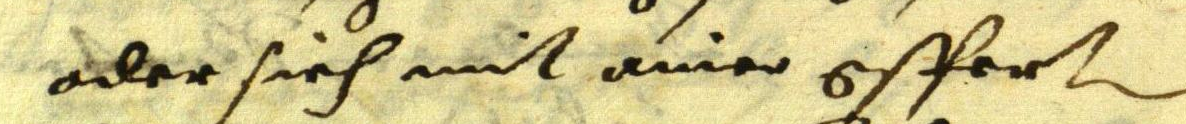aber sich mit ainer gsPert
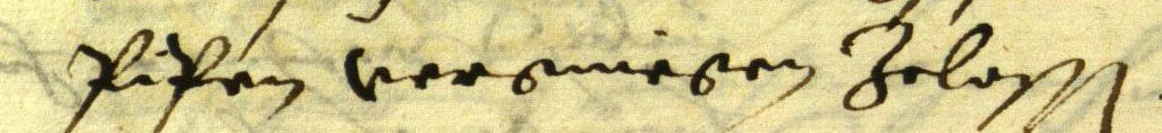PiPen vergniegen Zelass.
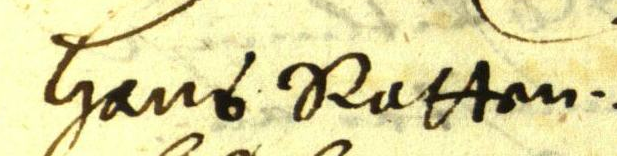Hans Rotten¬
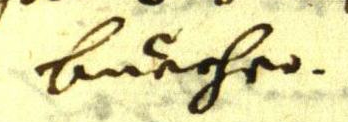būecher.
